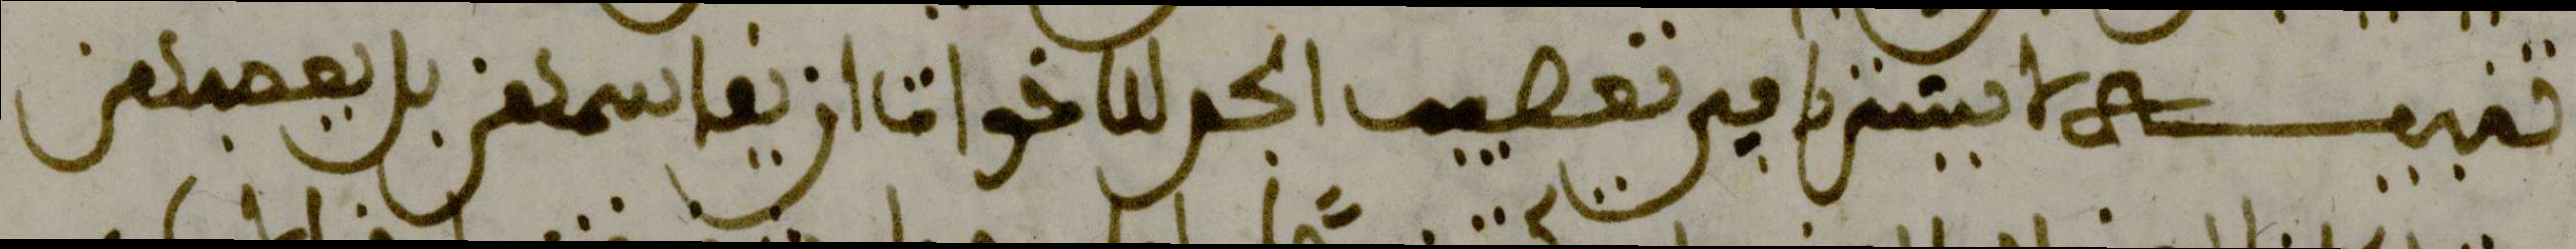تنبيه لا يشترط في تعصيب الجد للاخوات ان يقاسمهن بل يعصبهن
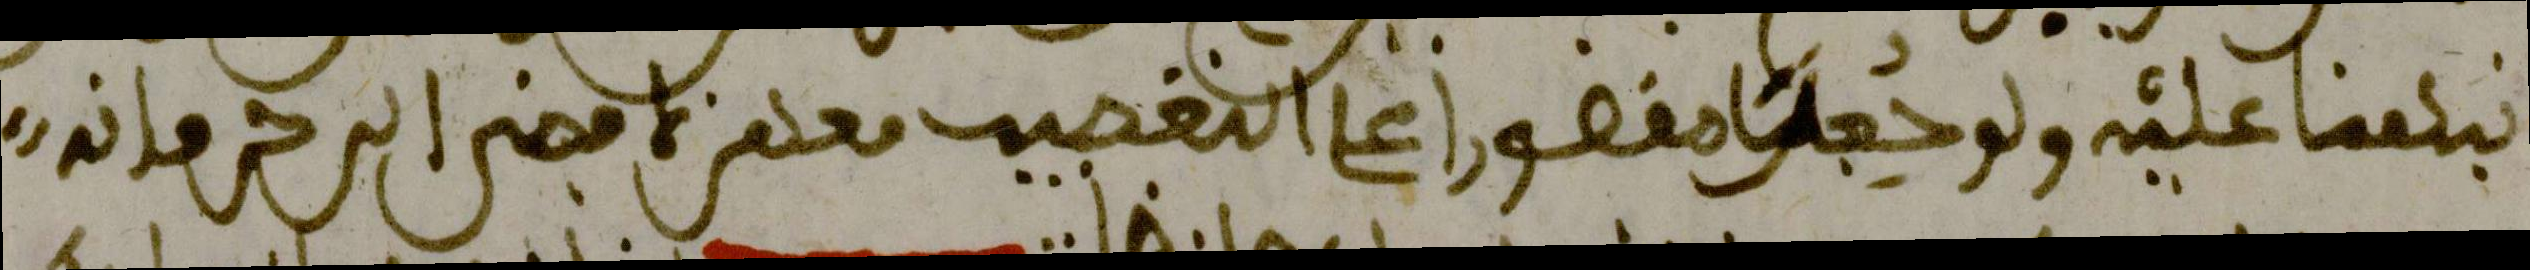نبهنا عليْه ولو جُعِلَ مقصور اعلى التعصيب معهن لاقضى الى حرمانه
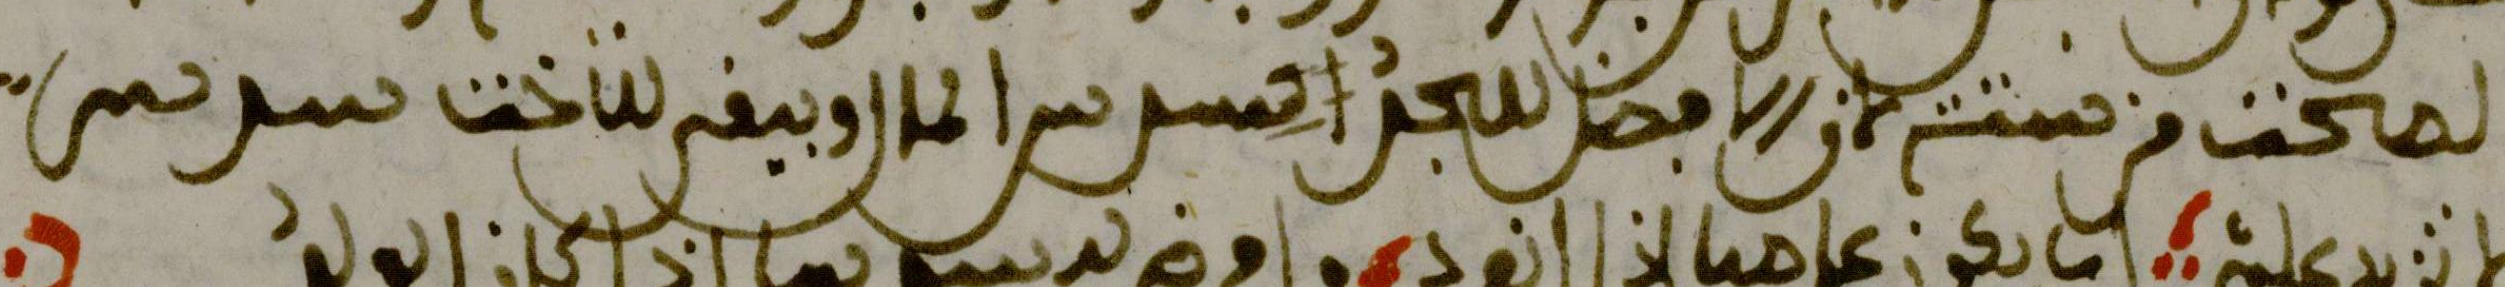لصححت من ستة لان الافضل للجد السدس المال ويبقى للاخت سدس
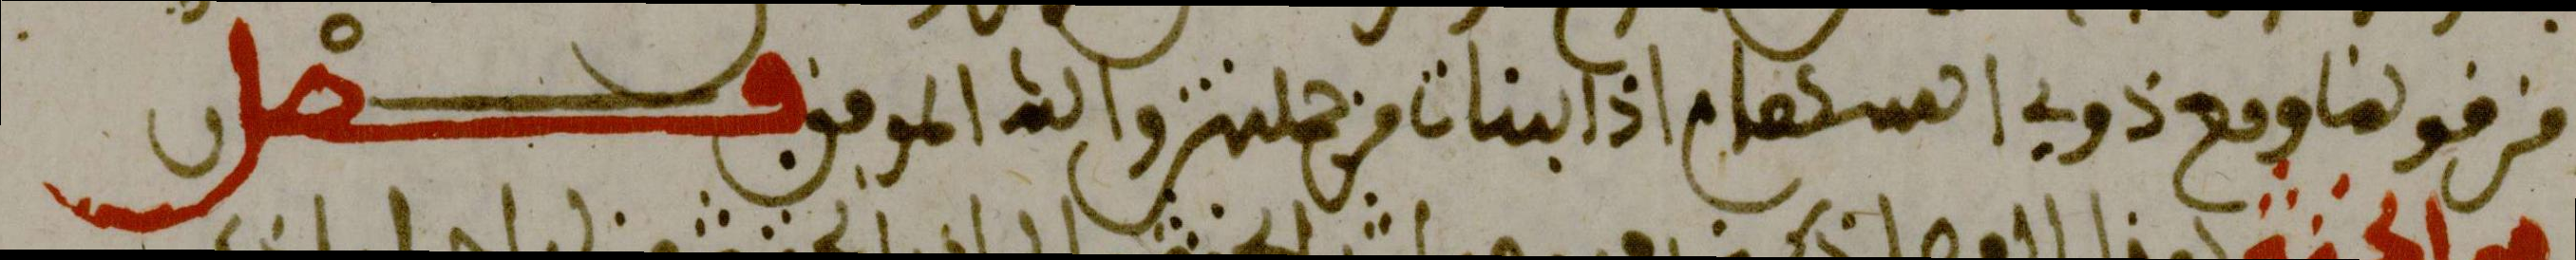من قولنا ومع ذوي السهام اذا لبنات من جملتهن والله الموفق فصْل
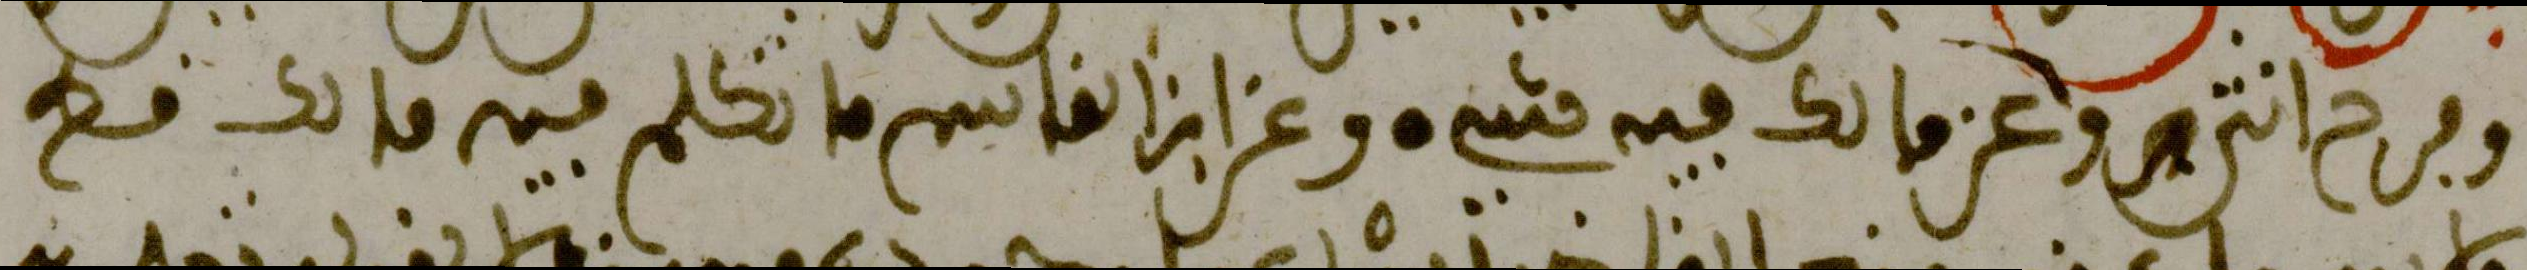وفرح انثى يرو عن مالك فيه شيء وعن ابن القاسم ما تكلم فيه مالك قط
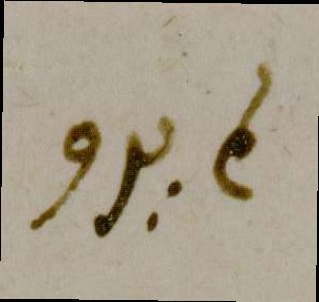ولم يرق
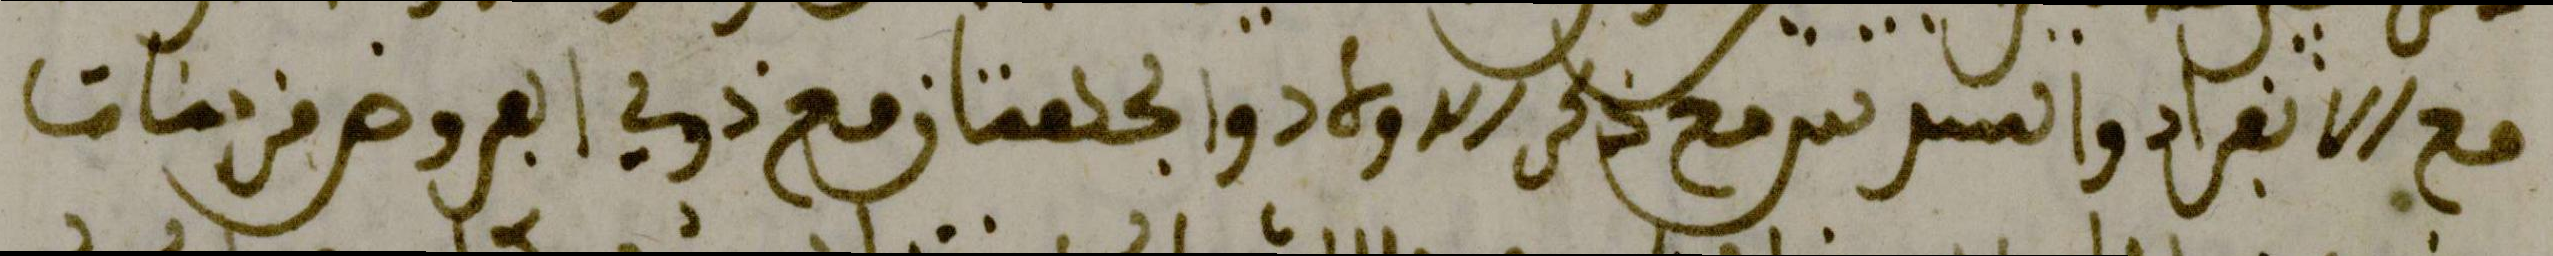مع الانفراد والسدس مع ذكر الاولاد والجهتان مع ذوي الفروض من بنات
